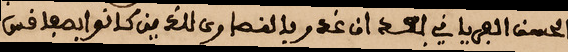الحسن الفرياني بعد ان غدر بالنصارى للذين كانوا بصفاقس
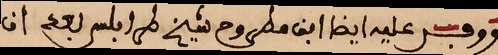ووفد عليه ايضا ابن مطروح شيخ طرابلسي بعد ان
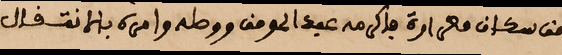من سكان معراوة فاكرمه عبد المومن ووصله وامره بالانتقال
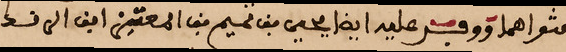مثواهما ووفد عليه ايضا يحيى بن تميم بن المعتيز ابن الرند
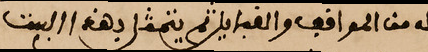له من المواقف والقبايل ثم يتمثل بهذا البيت
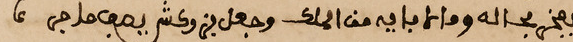يفخر بحاله وما لا بايه من الملك وجعل بزركش يصف ما جرى
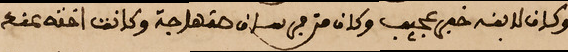وكان لابنه خبر عجيب وكان من فرسان صنهاجة وكانت اخته عند
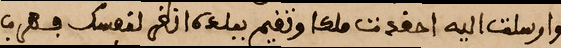وارسلت اليه احقدت ملكا وتقيم ببلده انظر لنفسك فهرب
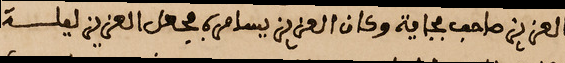العزيز صاحب بجاية وكان العزيز يسامره فجعل العزيز ليلة
